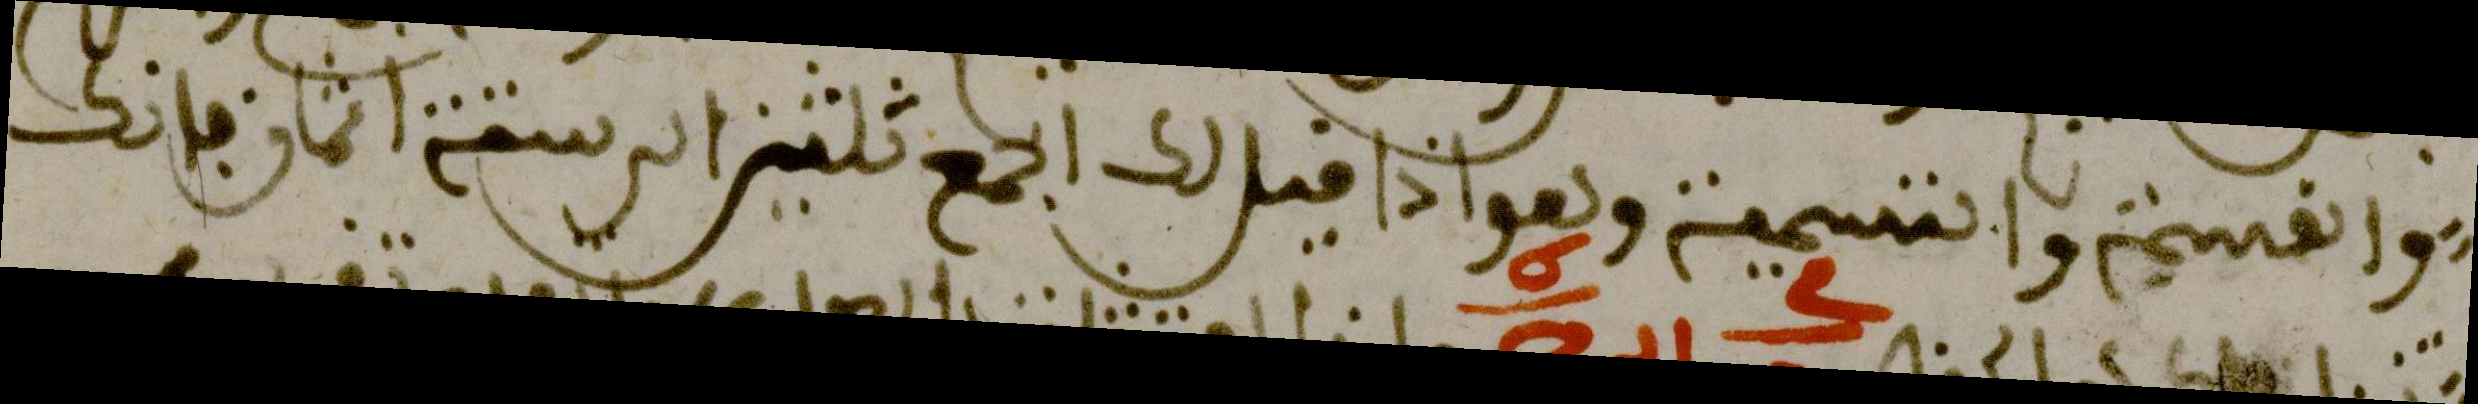والقسمة والتسمية وهو اذا قيل لك الجمع ثلثين الى ستة اثمان فانك
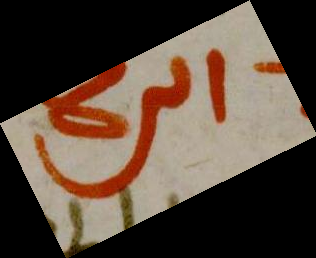الى
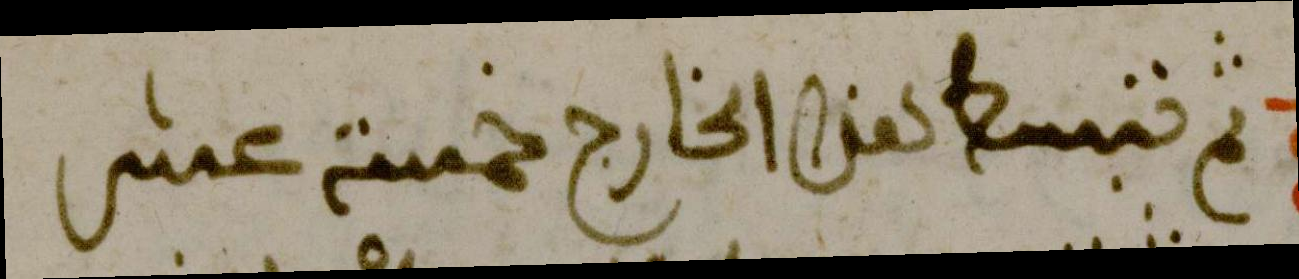ثم تبسط هذا الخارج خمسة عشر
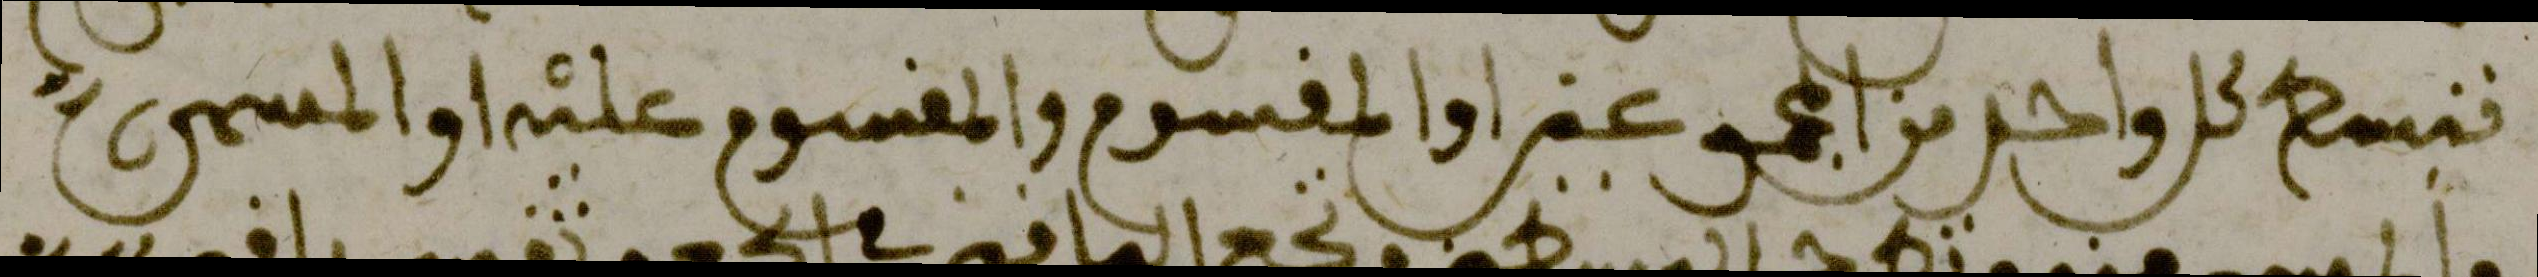تبسط كل واحد من المجموعين او المقسوم والمقسوم عليْه او المسمى
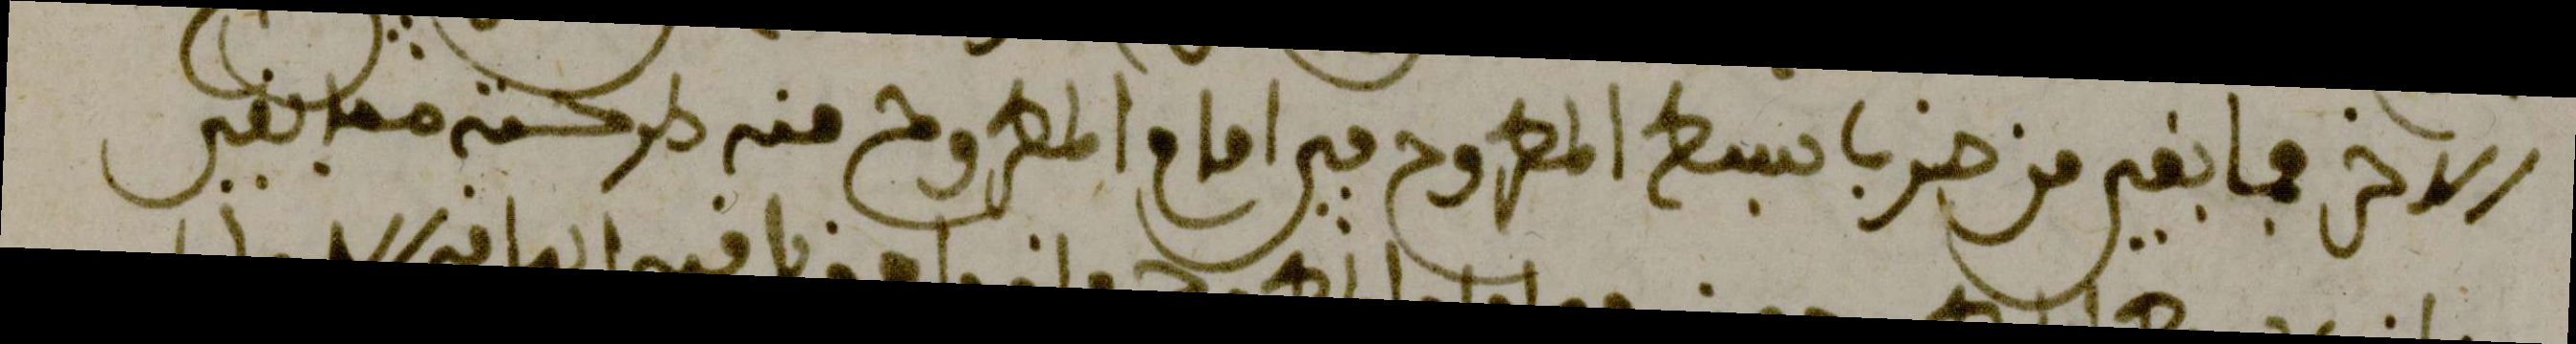الاخر فما بقي من ضرب بسط المطروح في امام المطروح منه طرحته مما بقي
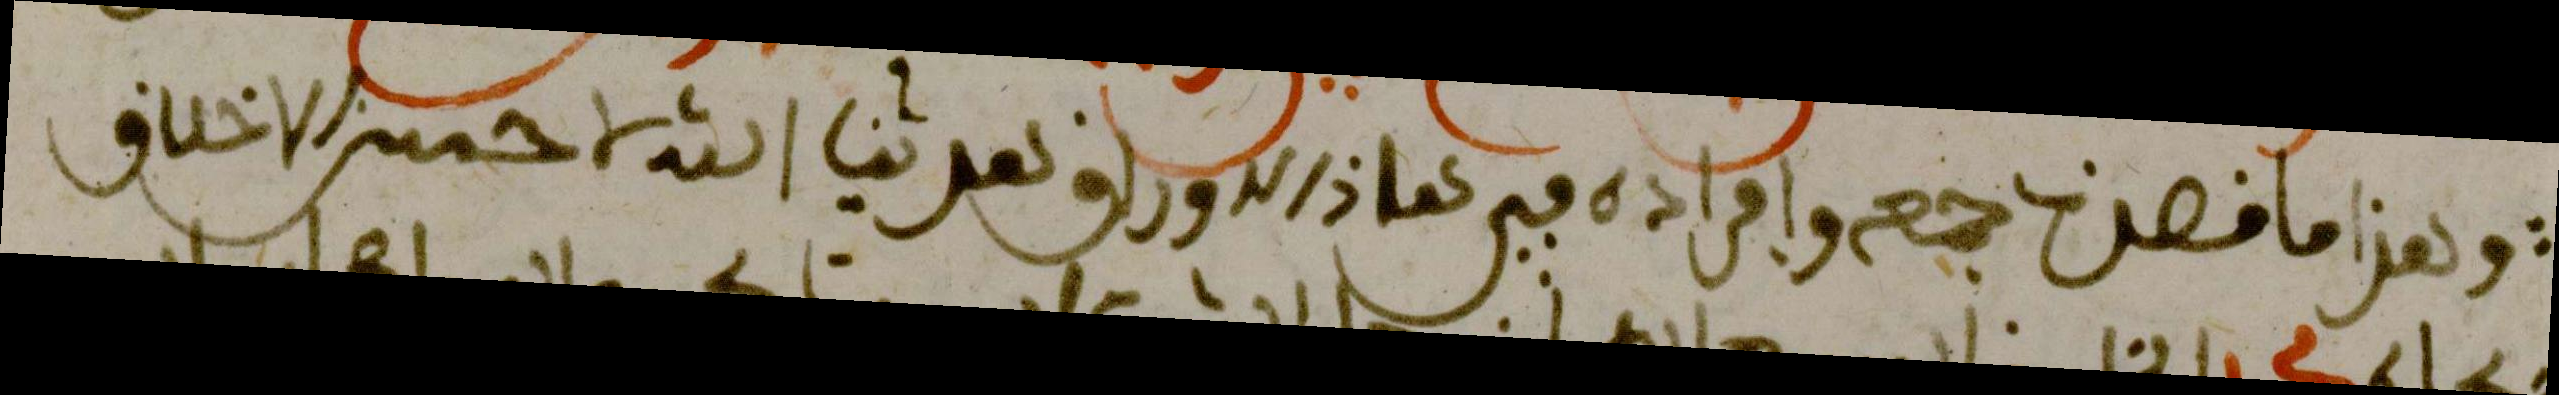وهذا ما قصدنا جمعه وافراده في هاذ الاوراق هدينا الله لاحسن الاخلاق
